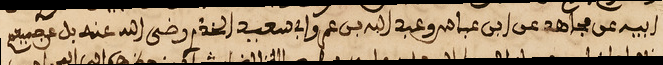ابيه عن مجاهد عن ابن عباس وعبد الله بن عمر وابي سعيد الخذرى رضى الله عنه بل عن جميعهم
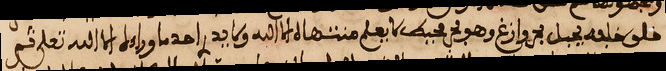خلق خلفه بجبل بحر وازغ وهو بحر محيط لا يعلم منتهاه الا الله ولا يدرى احد ما وراءه الا الله تعلى ثم
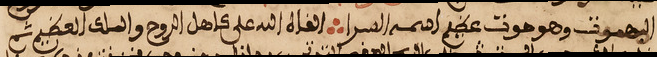البهموت وهو حوت عظيم اسمه السرا القاه الله على كاهل الروح والملك العظيم ثم
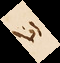انا
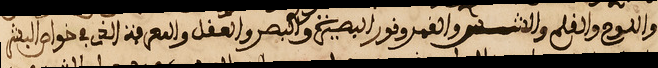واللوح والقلم والشمس والقمر ونور البصيرة والبصر والعقل والمعرفة الذي في خواص البشر
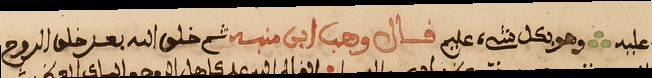عليه وهو بكل شىء عليم قال وهب ابن منبه ثم خلق الله بعد خلق الروح
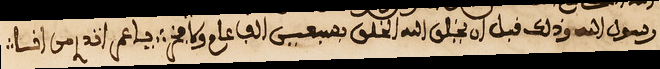رسول الله وذلك قبل ان يخلق الله الخلق بسبعين الف عام ولا فخر يا عمر اتدرى من انا
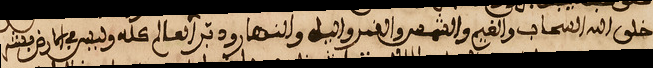خلق الله السحاب والغيم والشمس والقمر واليل والنهار ودبر العالم كله وليس في الارض بشر
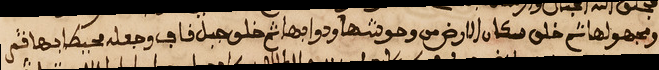ومجهولها ثم خلق سكان الارض من وحوشها ودوابها ثم خلق جبل قاف وجعله محيطا بها ثم
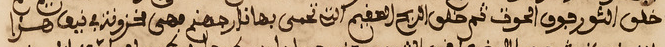خلق الثور فوق الحوت ثم خلق الريح العقيم التي تحمى بها نار جهنم فهى مخزونة في نيف هذا
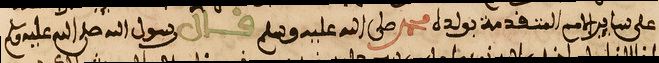على سائر الامم المتقدمة بولده محمد صلى الله عليه وسلم قال رسول الله صلى الله عليه وسلم
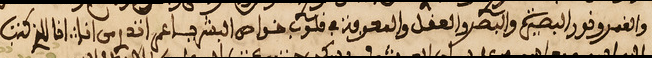والقمر ونور البصيرة والبصر والعقل والمعرفة في قلوب خواص البشريا عمر اتدرى من انا انا الذي كتب
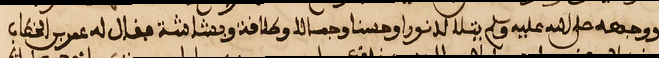ووجهه صلى الله عليه وسلم يتلالا نورا وحسنا وجمالا وطاقة وبشاشة فقال له عمر بن الخطاب
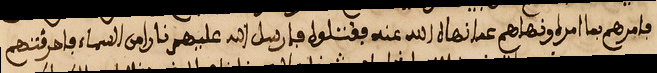فامرهم بما امره ونهاهم عما نهاه الله عنه فقتلوه فارسل الله عليهم نارا من السماء فاحرقتهم
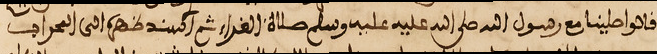قالوا صلينا مع رسول الله صلى الله عليه عليه وسلم صلاة الغداء ثم اسند ظهره الى المحراب
